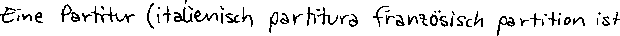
Eine Partitur (italienisch partitura französisch partition ist
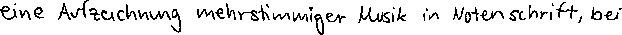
eine Aufzeichnung mehrstimmiger Musik in Notenschrift, bei
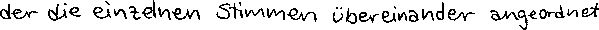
der die einzelnen Stimmen übereinander angeordnet
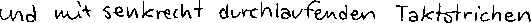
und mit senkrecht durchlaufenden Taktstrichen
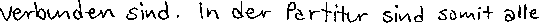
verbunden sind. In der Partitur sind somit alle
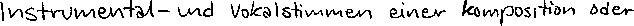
Instrumental- und Vokalstimmen einer Komposition oder
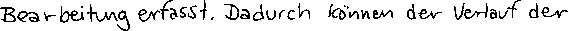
Bearbeitung erfasst. Dadurch können der Verlauf der
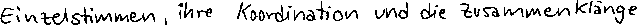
Einzelstimmen, ihre Koordination und die Zusammenklänge
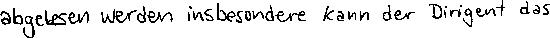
abgelesen werden insbesondere kann der Dirigent das
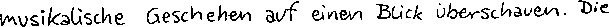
musikalische Geschehen auf einen Blick überschauen. Die
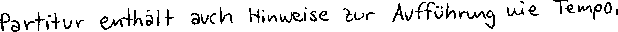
Partitur enthält auch Hinweise zur Aufführung wie Tempo,
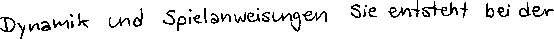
Dynamik und Spielanweisungen. Sie entsteht bei der
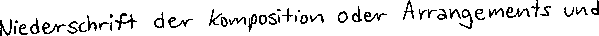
Niederschrift der Komposition oder eines Arrangements und
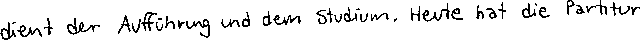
dient der Aufführung und dem Studium. Heute hat die Partitur
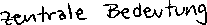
zentrale Bedeutung
